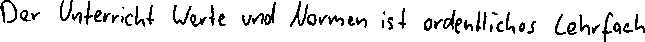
Der Unterricht Werte und Normen ist ordentliches Lehrfach
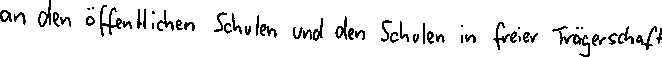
an den öffentlichen Schulen und den Schulen in freier Trägerschaft
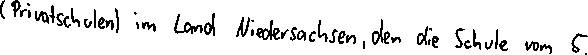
(Privatschulen) im Land Niedersachsen, den die Schule vom 5.
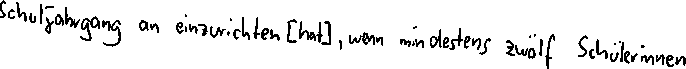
Schuljahrgang an einzurichten [hat], wenn mindestens zwölf Schülerinnen
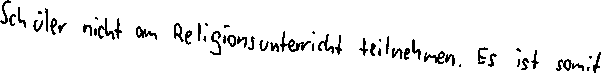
Schüler nicht am Religionsunterricht teilnehmen. Es ist somit
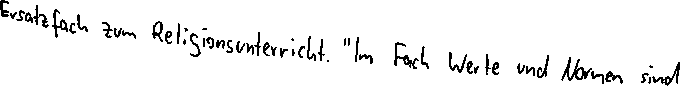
Ersatzfach zum Religionsunterricht. "Im Fach Werte und Normen sind
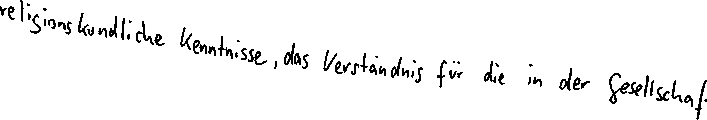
religionskundliche Kenntnisse, das Verständnis für die in der Gesellschaft
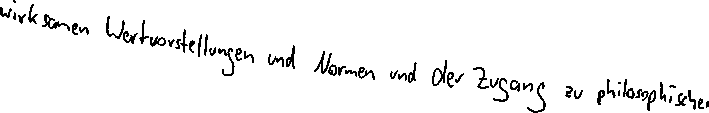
wirksamen Wertvorstellungen und Normen und der Zugang zu philosophischen,
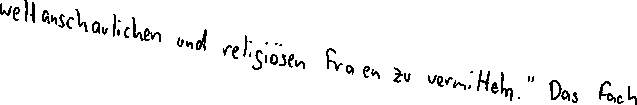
weltanschaulichen und religiösen Fragen zu vermitteln." Das Fach
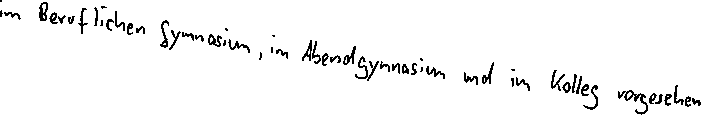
im Beruflichen Gymnasium, im Abendgymnasium und im Kolleg vorgesehen
